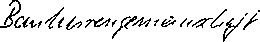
Bauherrengemeinschaft
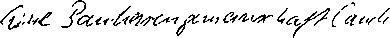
Eine Bauherrengemeinschaft (auch B
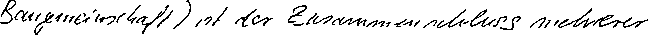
Baugemeinschaft) ist der Zusammenschluss mehrerer
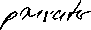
privater
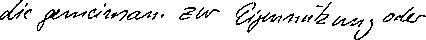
die gemeinsam zur Eigennutzung oder
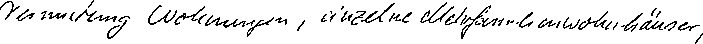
Vermietung Wohnungen, einzelne Mehrfamilienwohnhäuser,
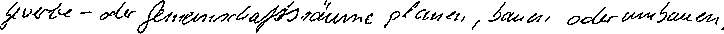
Gewerbe- oder Gemeinschaftsräume planen, bauen oder umbauen.
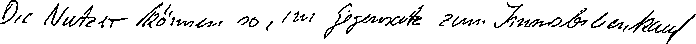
Die Nutzer können so, im Gegensatz zum Immobilienkauf
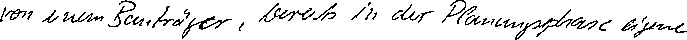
von einem Bauträger, bereits in der Planungsphase eigene
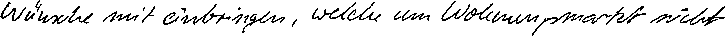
Wünsche mit einbringen, welche am Wohnungsmarkt nicht
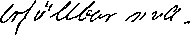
erfüllbar sind.
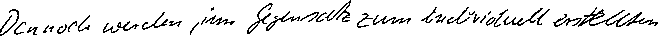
Dennoch werden, im Gegensatz zum individuell erstellten
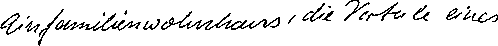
Einfamilienwohnhaus, die Vorteile eines
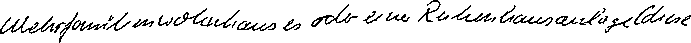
Mehrfamilienwohnhauses oder einer Reihenhausanlage (diese
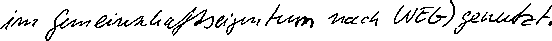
im Gemeinschaftseigentum nach WEG) genutzt.
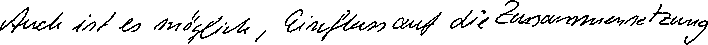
Auch ist es möglich, Einfluss auf die Zusammensetzung
